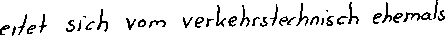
leitet sich vom verkehrstechnisch ehemals
